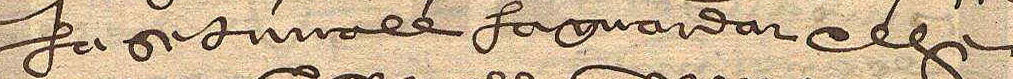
ha setuuall haguardar e lhe
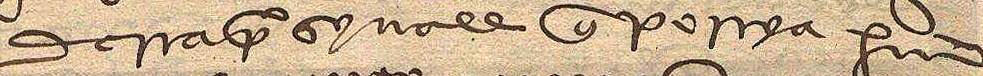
derra p̄o synall q̄ porrya hū
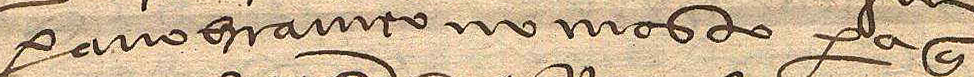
pano brramco no masto ꝑa q̄
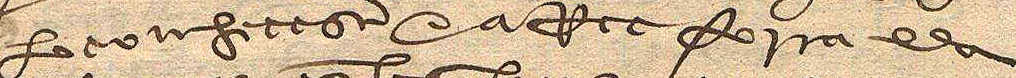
ho conhecesē e a Ree forra lla
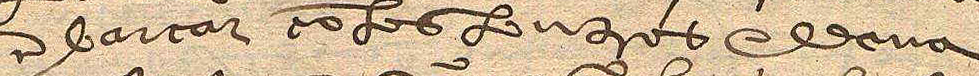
ēbarcar c̄o hos houtros e lleua
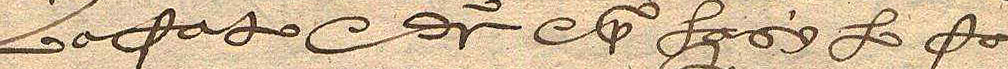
va fato e dro e p̄o hasy fa
